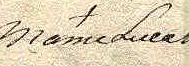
MameLuca
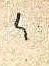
4
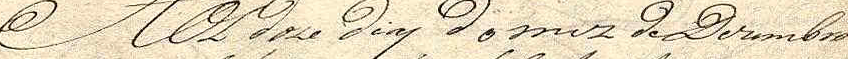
Aos doze dias do mez de Dezembro
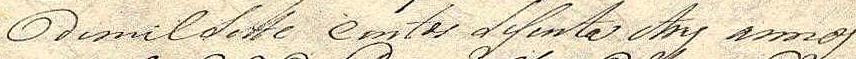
de mil e Sette centos sesenta e tres annos
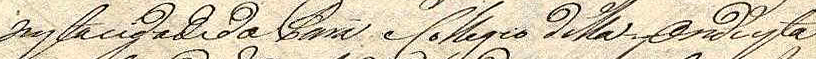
nesta cidade do Pará e Collegio della onde esta
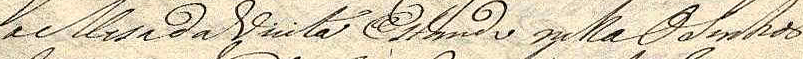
a Mesa da Vizita estando nella O senhor
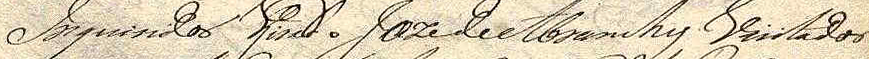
Inquisidor Giraldo Joze de Abranches Visitador
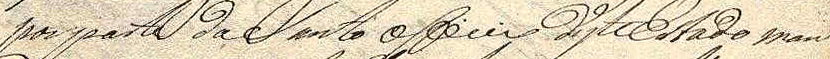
por parte da Santo oficio deste Estado man
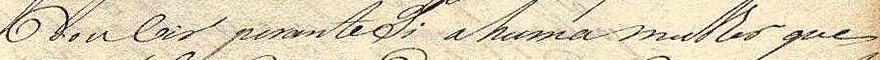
dou vir perante Si a huma mulher que
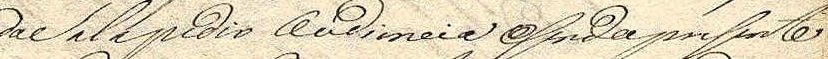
da sala pedio audiencia e sendo presente
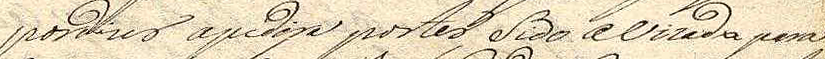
por dizer a pedira por ter sido avizada para
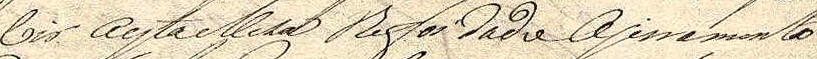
vir aesta Mesa lhe foi dado o juramento
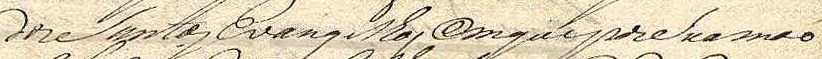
dos santos Evangelhos em que poz sua maõ
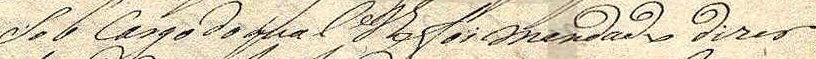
sob cargo do qual lhe foi mandado dizer
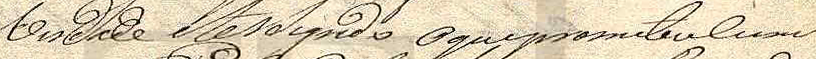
verdade e ter segredo o que prometeu cum
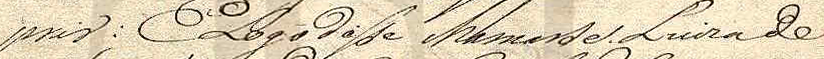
prir: E Logo disse chamarse. Luiza de
